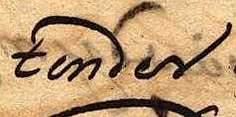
tender.
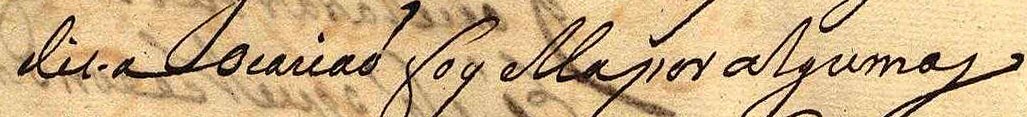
dita ocaziaõ foy ella por algumas
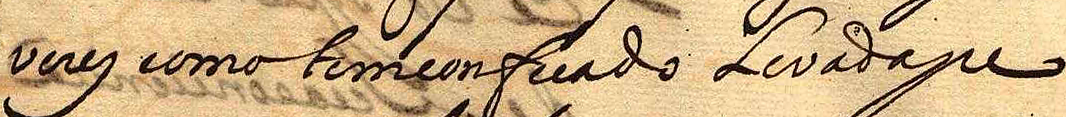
vezes como tem confeçado Levada pe
